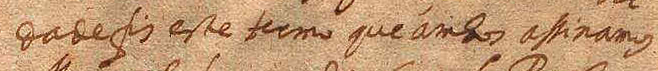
dade fis este termo que ambos assinamos
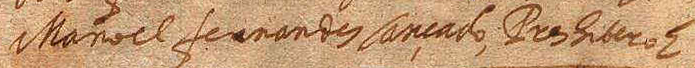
Manoel fernandes Cançado, Presbitero E
